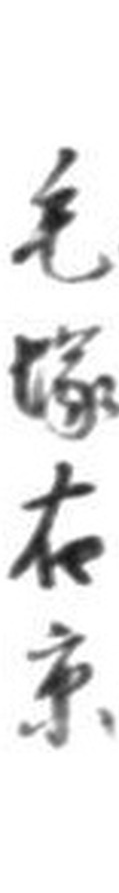毛塚右京
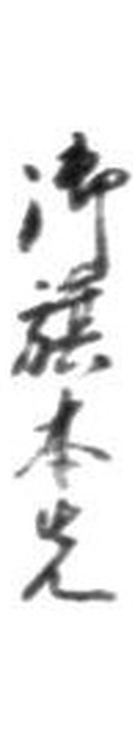御旗本先
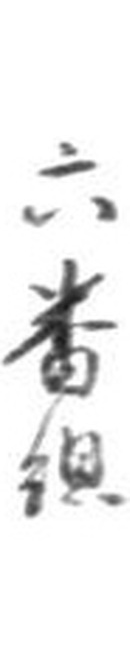六番組
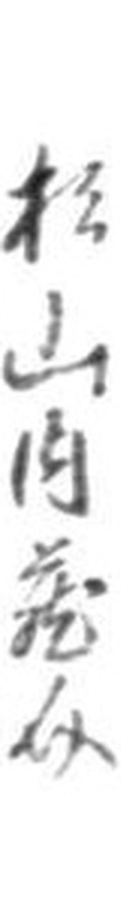松山内蔵介
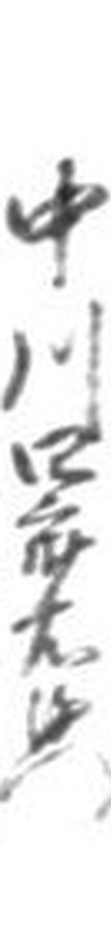中川四郎右衛門
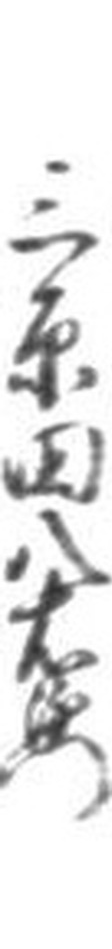三原田八右衛門
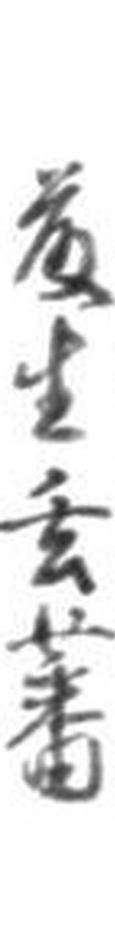藤生玄蕃
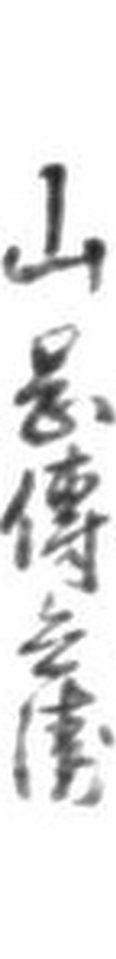山岡伝兵衛
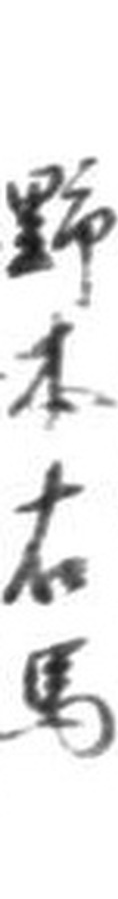野本右馬
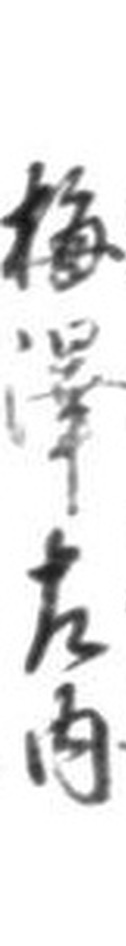梅沢左内
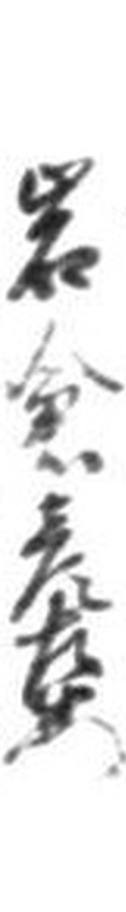岩倉彦左衛門
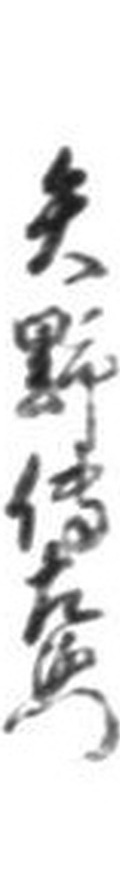矢野伝左衛門

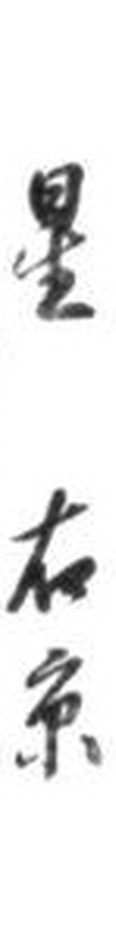星右京
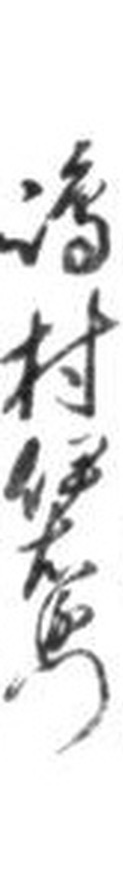嶋村伊右衛門
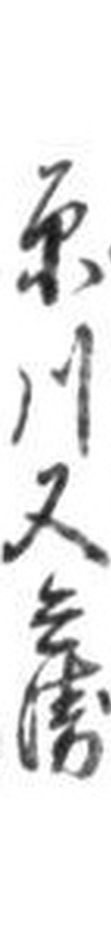原川又兵衛
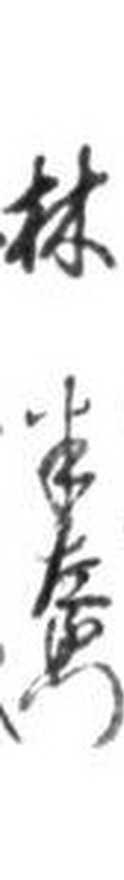林半左衛門
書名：家譜 二 忠直公 従文禄四年到慶安四年
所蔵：福井県文書館 Fukui Prefectural Archives
